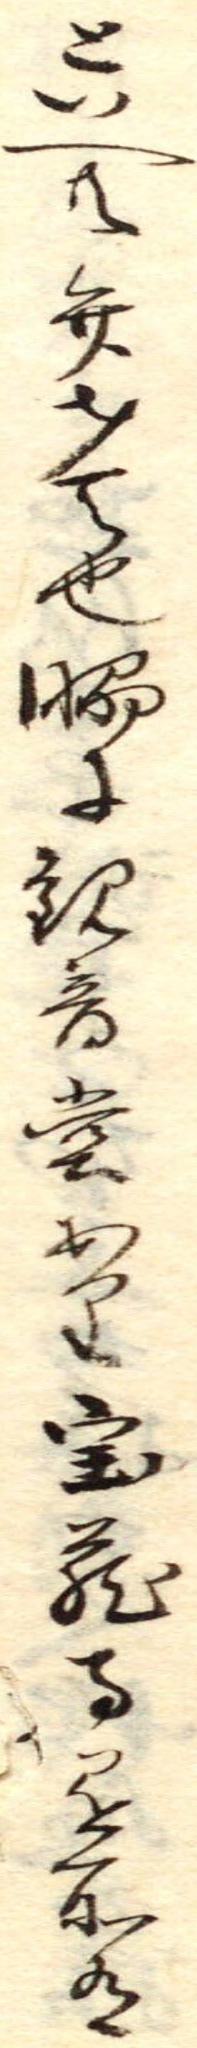といへ共弁才天也脇に観音堂あり宝蔵寺懸所有
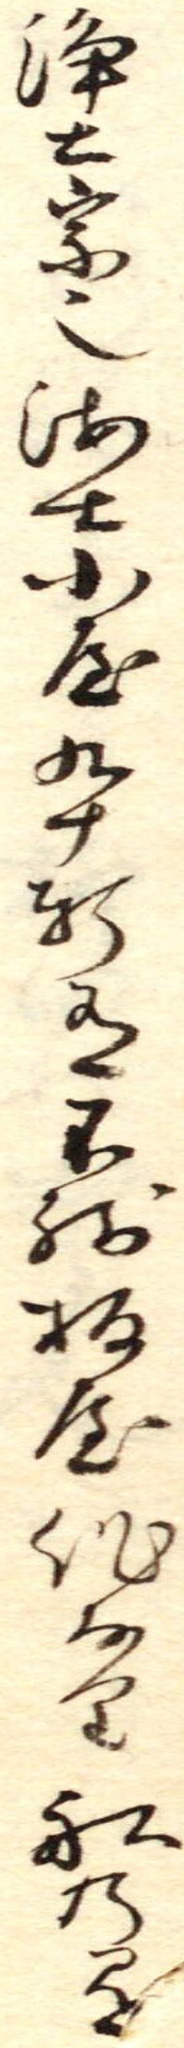浄土宗也海士小屋九十軒有不残板屋作なり船の懸
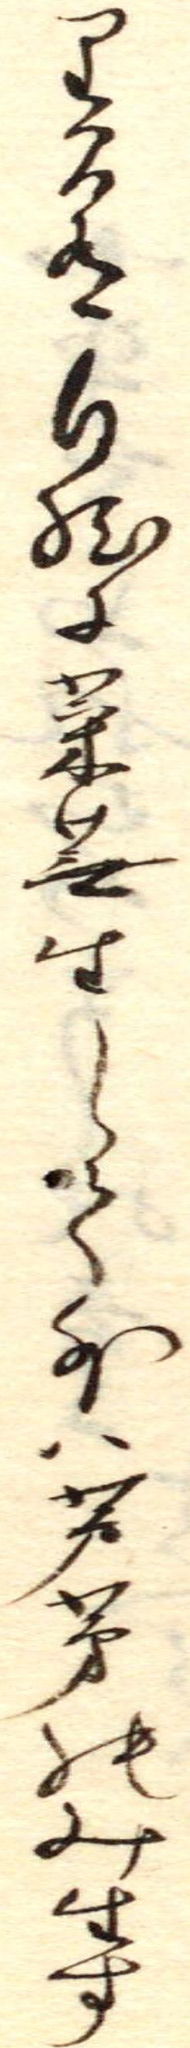り間有自然に菜蕪生して外は芦茅のみ生す
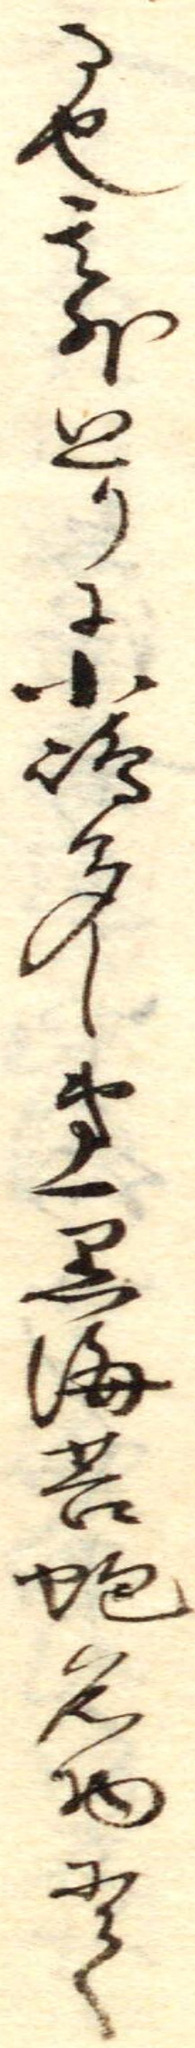る也其外廻りに小嶋多し第一黒海苔蚫名物にて
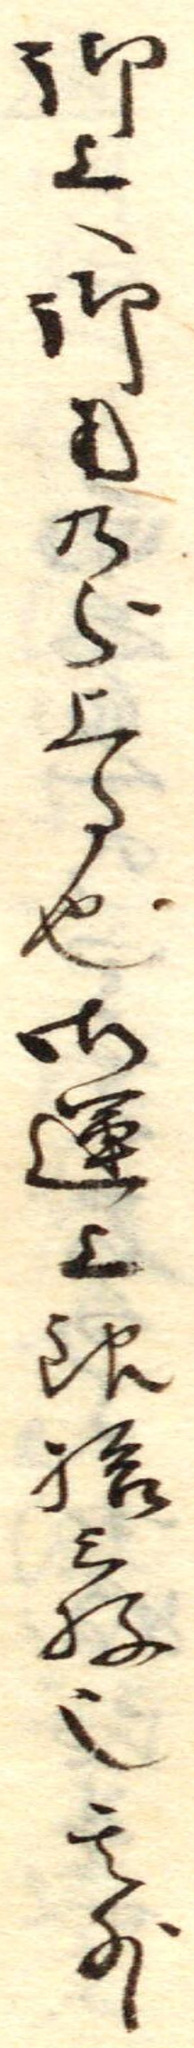御上へ御用の分上る也御運上銀拾三枚也其外
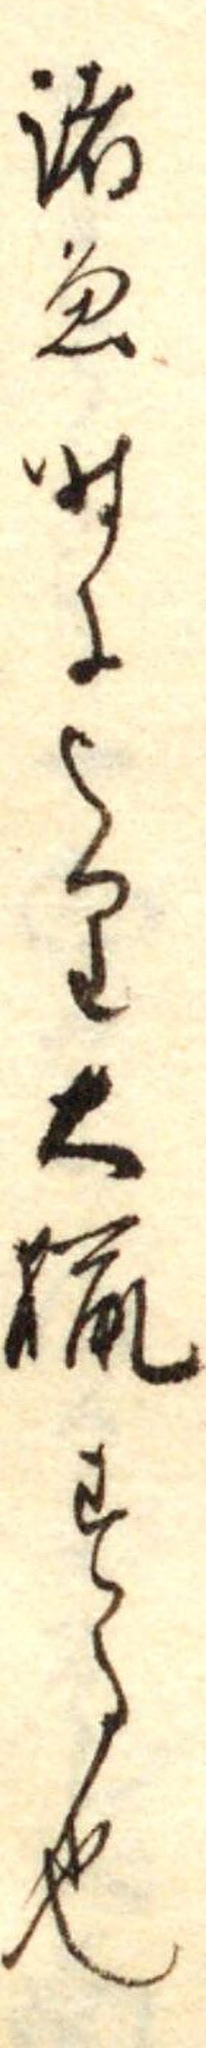諸魚時により大猟する也

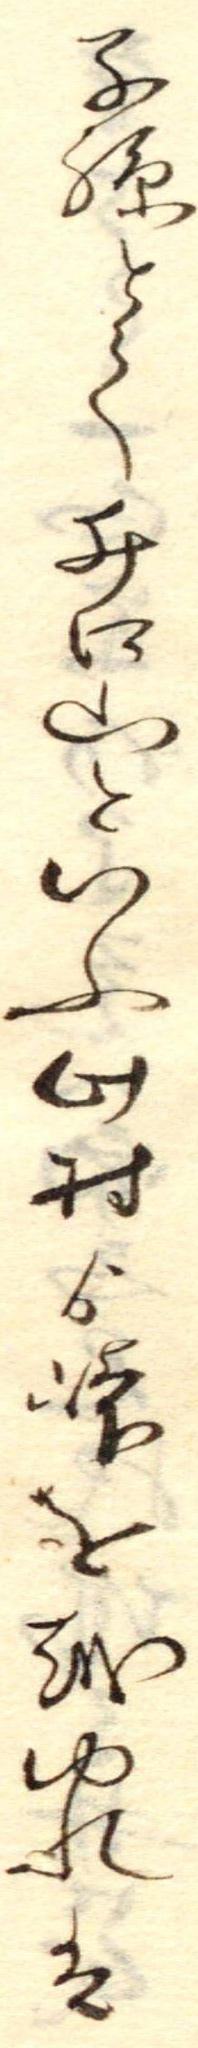子孫とて井口山といふ此村ゟ峠を越ゆれは
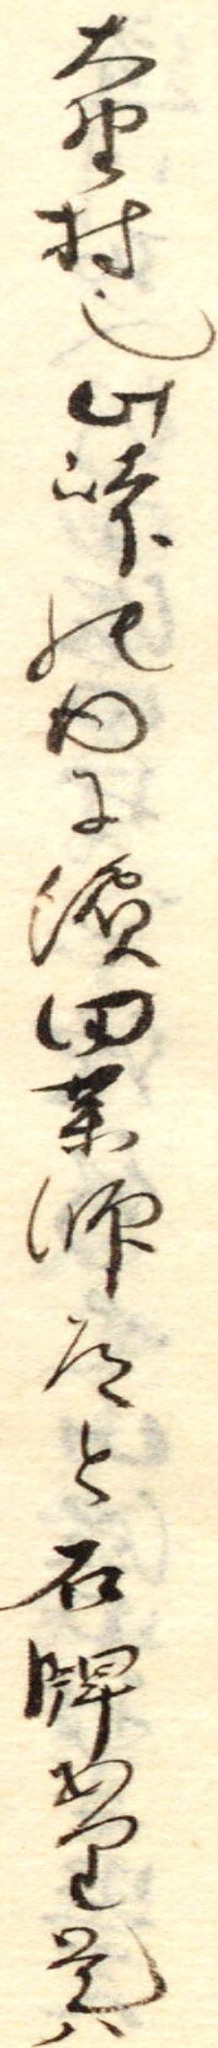大野村也此峠の内に浜田薬師道と石脾あり是は
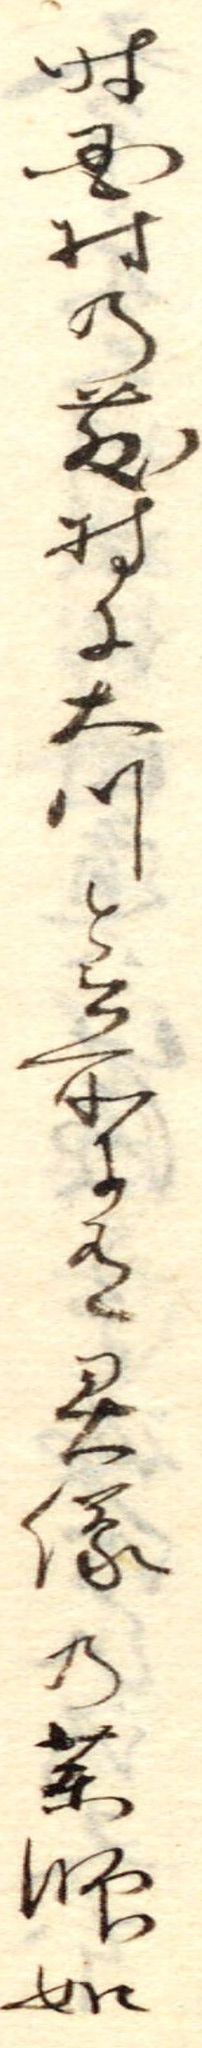時国村の散村に大川と云所に異像の薬師如
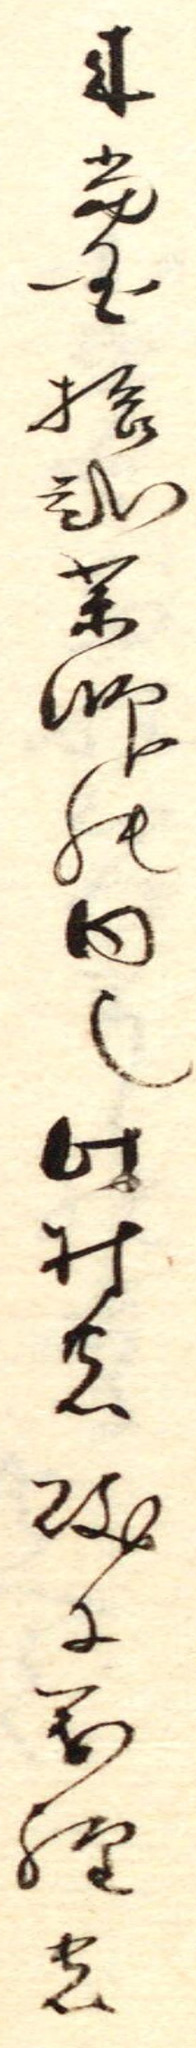来当国拾弐薬師の内也此村の礒に義経の
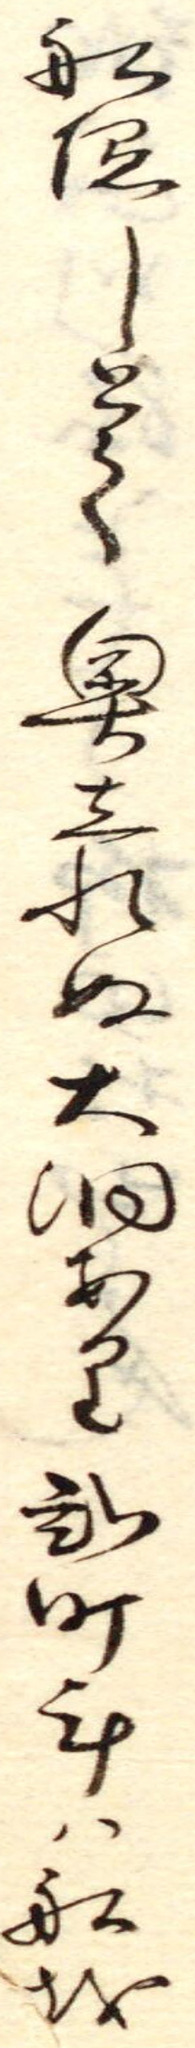船隠しとて奥しれぬ大洞あり弐町斗は船を
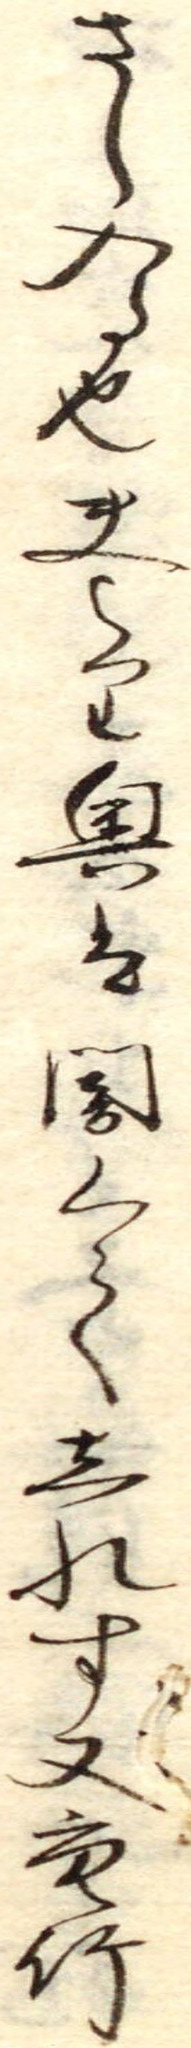さし入る也夫より奥は闇くてしれす又唐竹
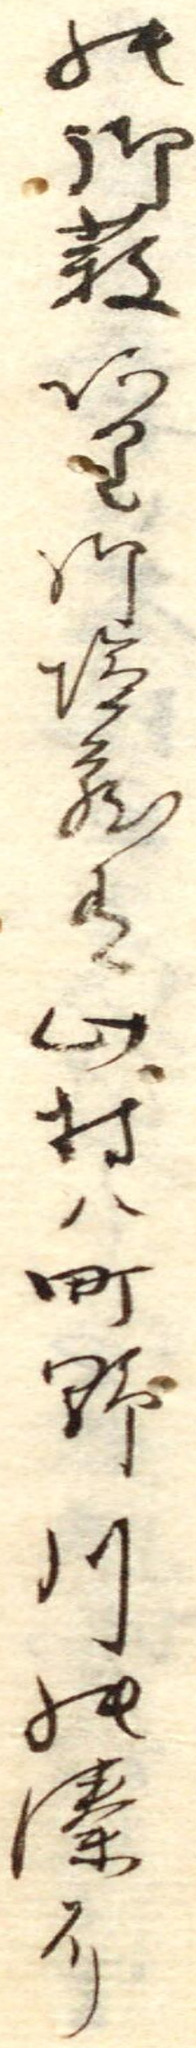の御薮あり御塩蔵有此村は町野川の湊に
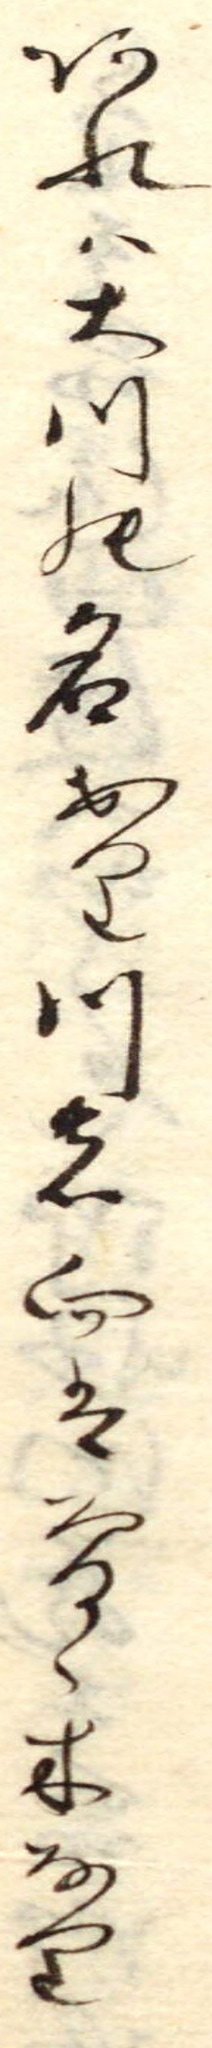あれは大川の名あり川の向は曽々木なり
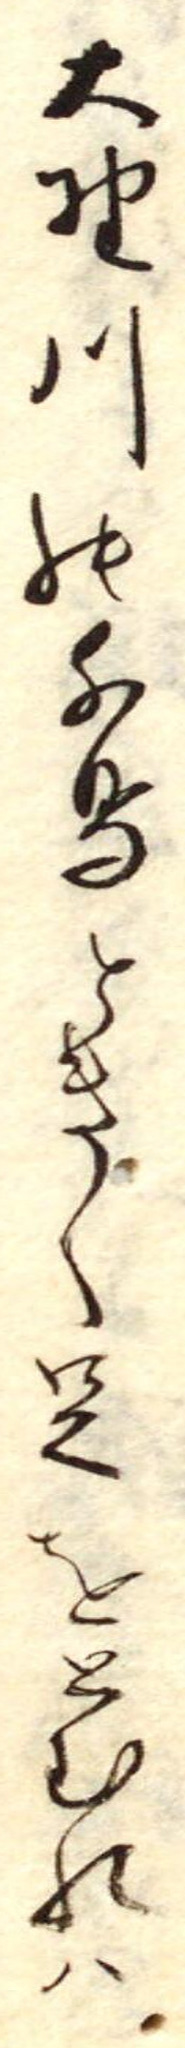大野川の千鳥とき〳〵足をとむれは
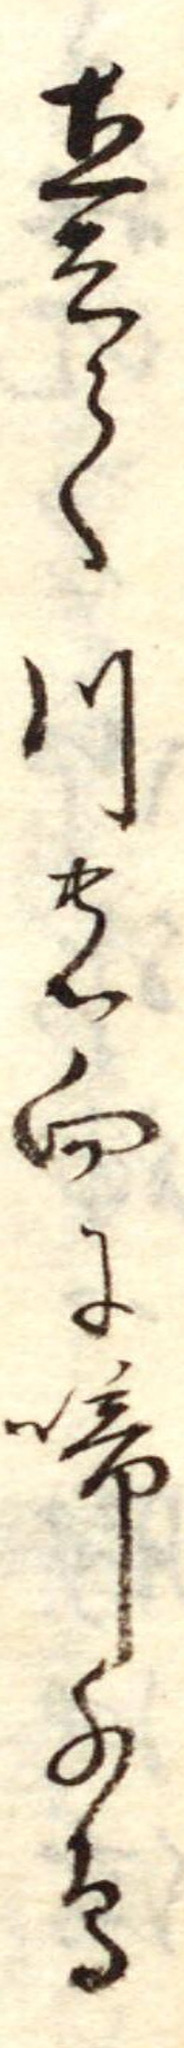立去て川の向に啼千鳥
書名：能登名跡誌
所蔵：Ishikawa Prefectural Library
